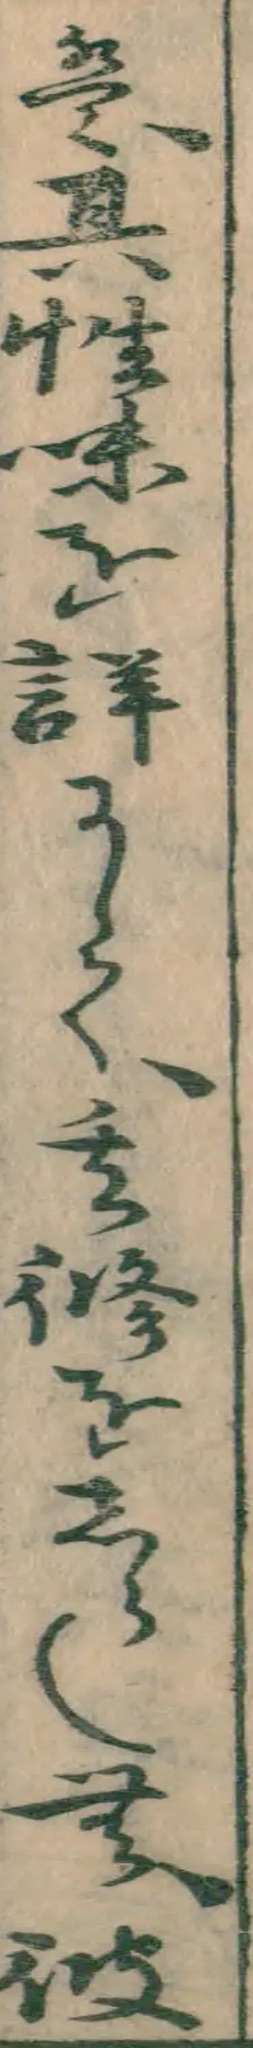は、其性味を詳にして、其修をしらしむ、彼
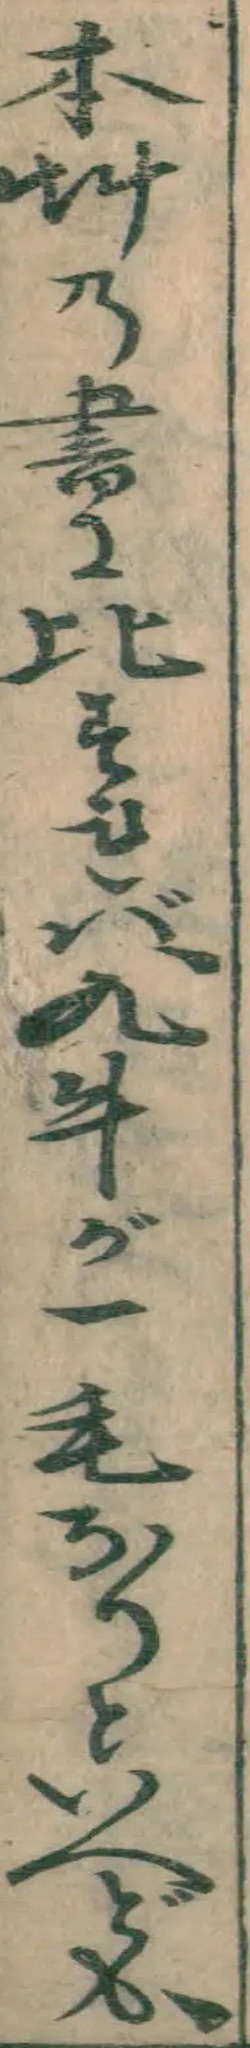本草の書に比すれば、九牛が一毛なりといへども、

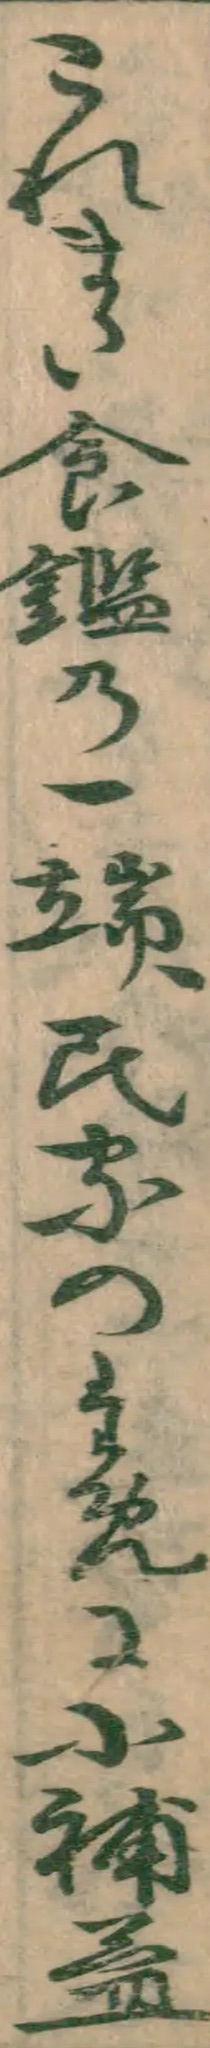これまた食鑑の一端、民家のために小補益
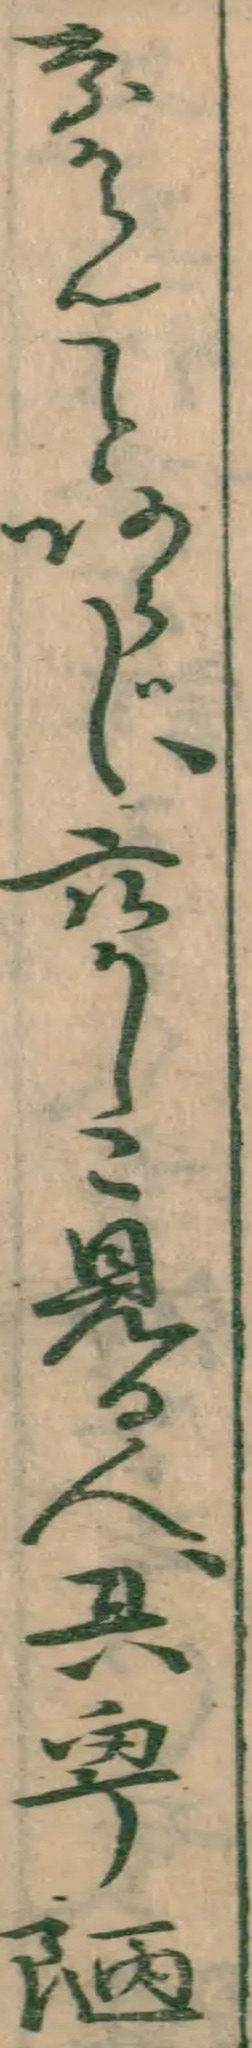なからんことあらじ、穴かしこ見る人、其卑陋
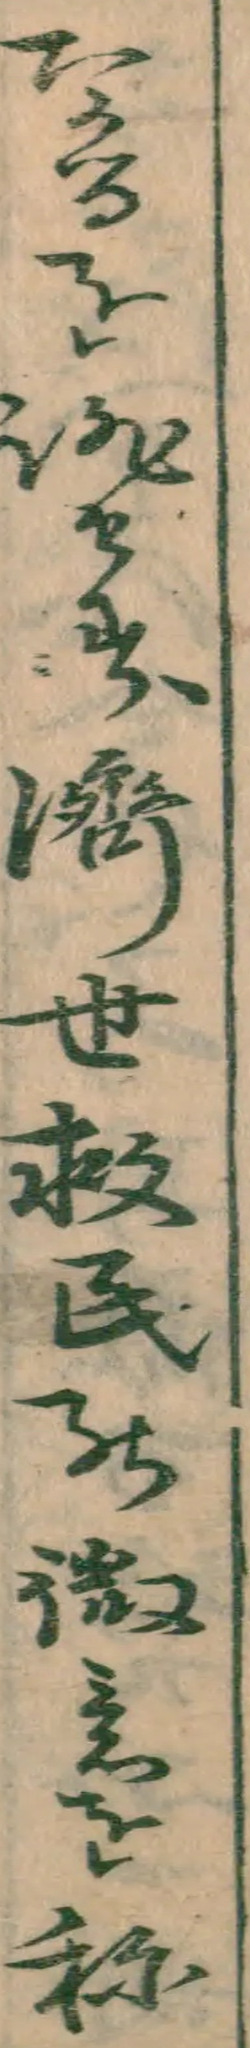なるを誹せす、済世救民の微意を称
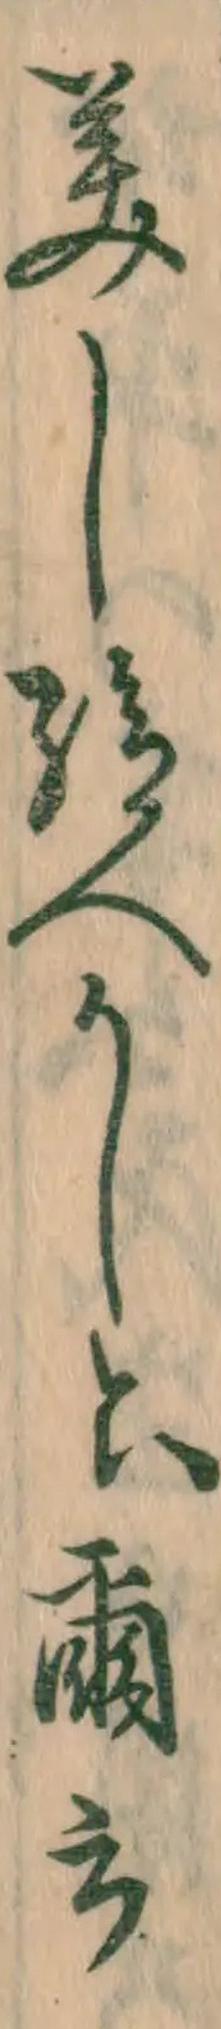美し給へかしと、爾云
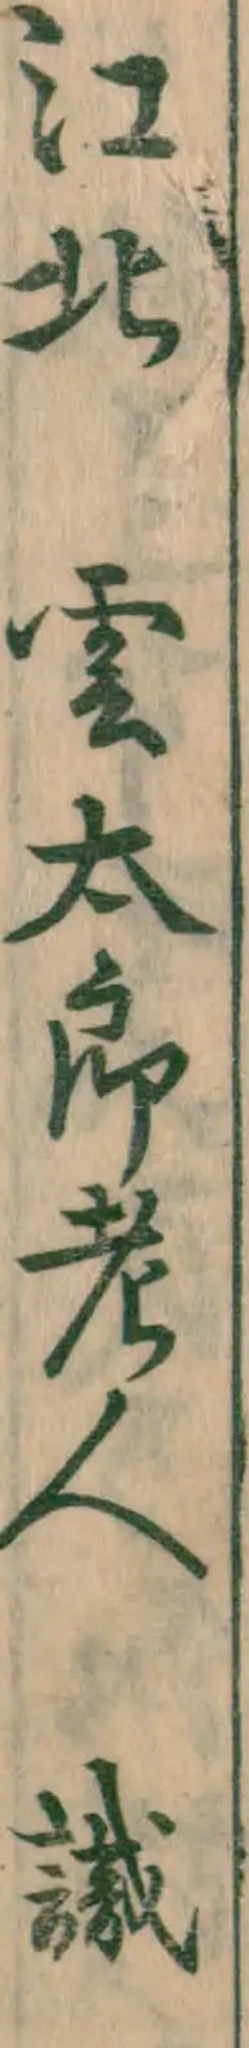江北雲太郎老人識
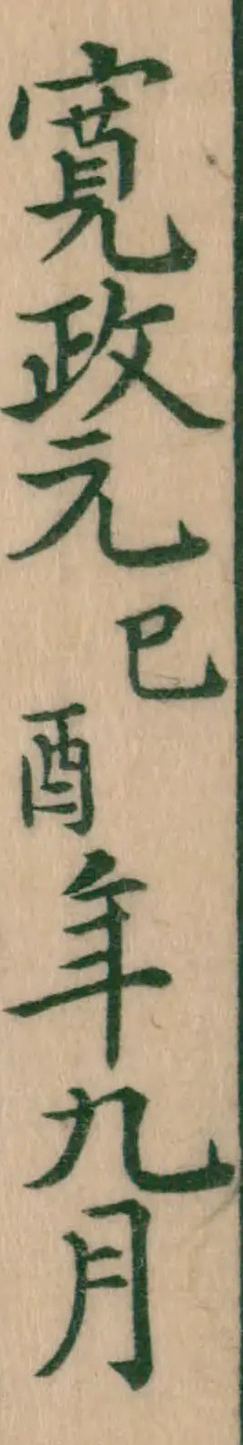寛政元己酉年九月
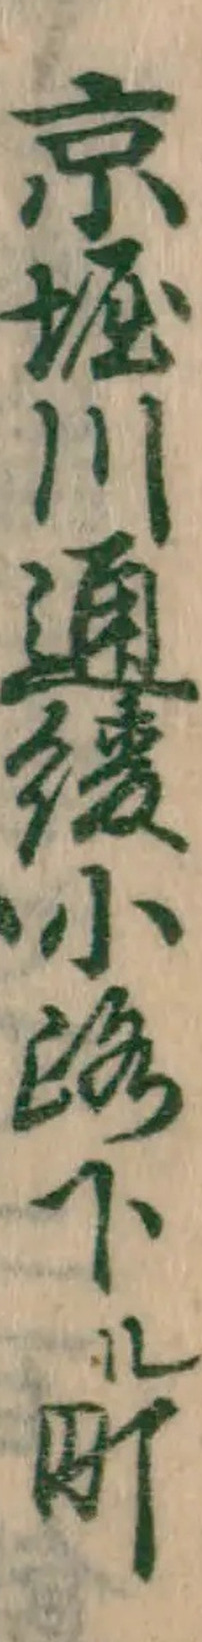京堀川通綾小路下ル町
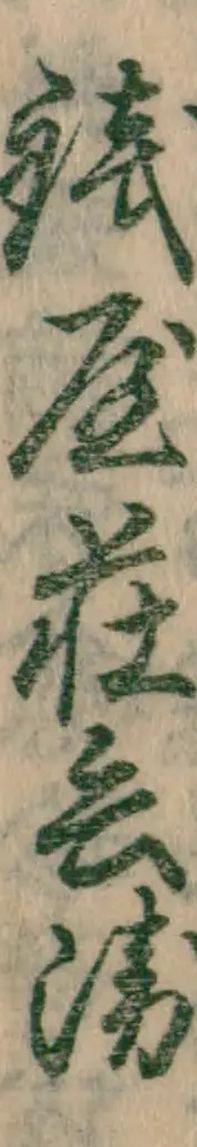銭屋荘兵衛
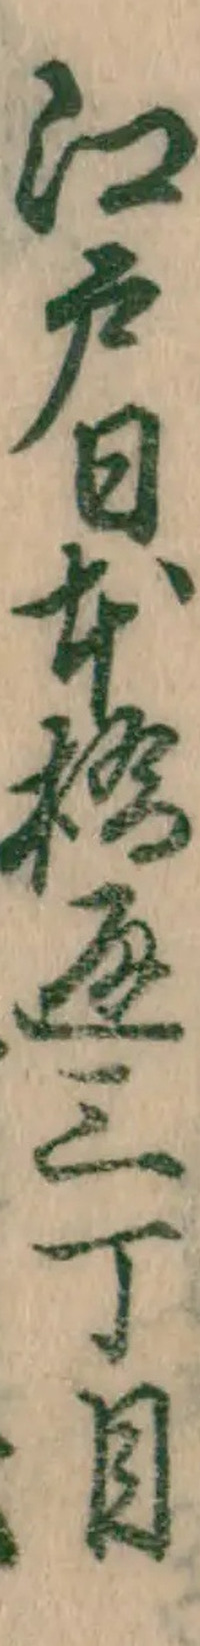江戸日本橋通三丁目
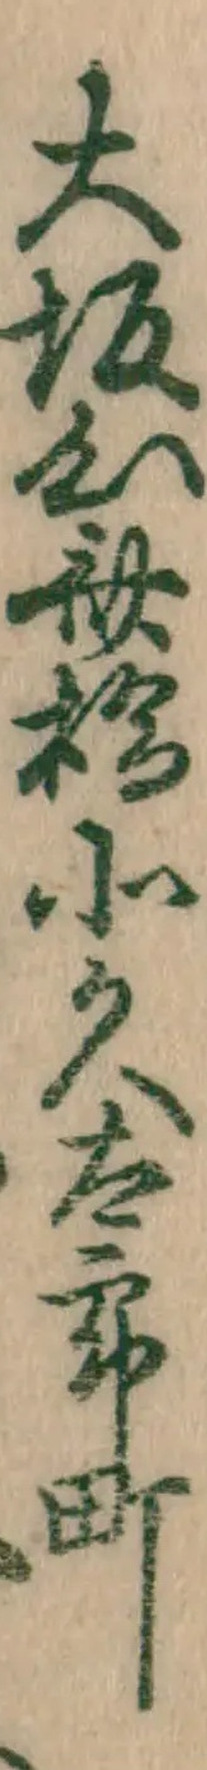大坂心斎橋北久太郎町
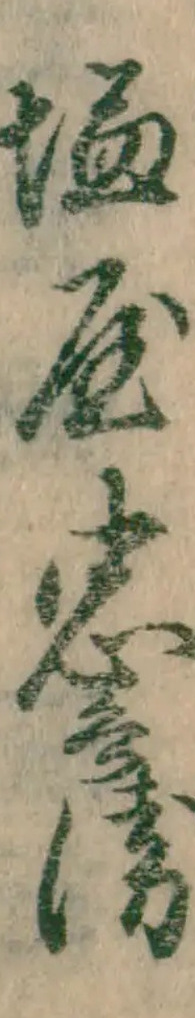塩屋忠兵衛
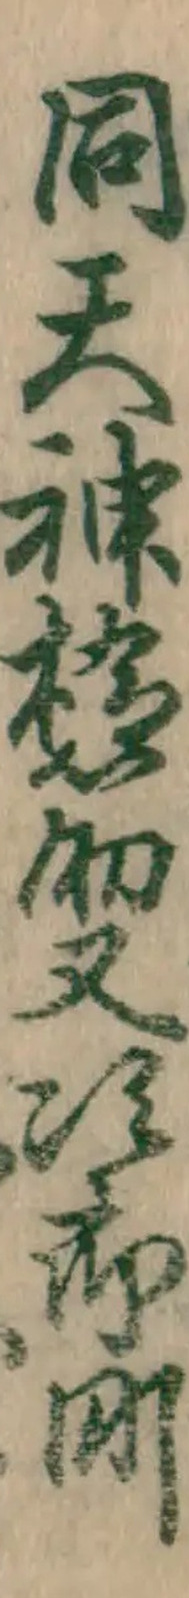同天神橋筋又次郎町
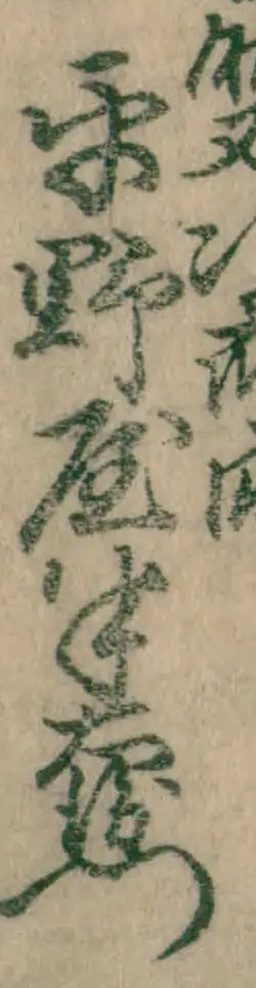平野屋半右衛門

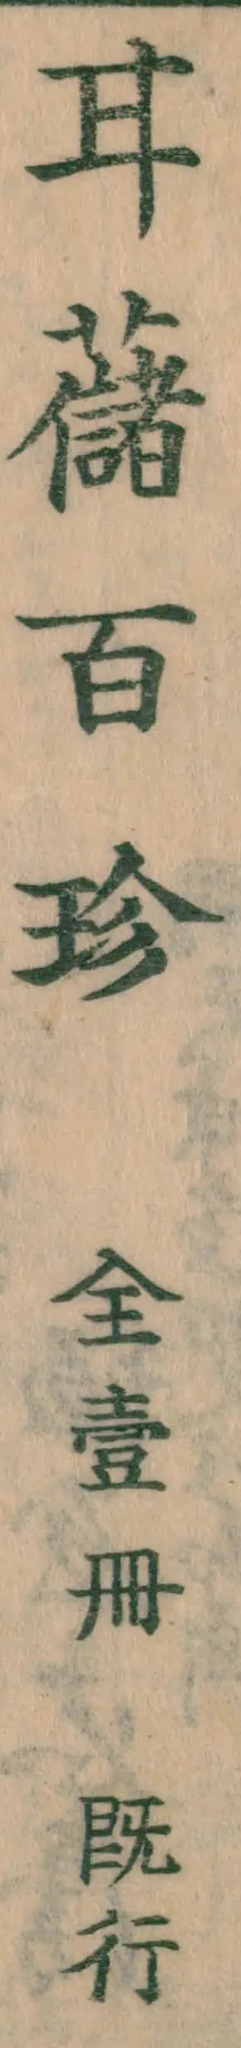甘藷百珍全壱冊既行
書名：甘藷百珍
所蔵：国立国会図書館 National Diet Library, JAPAN
